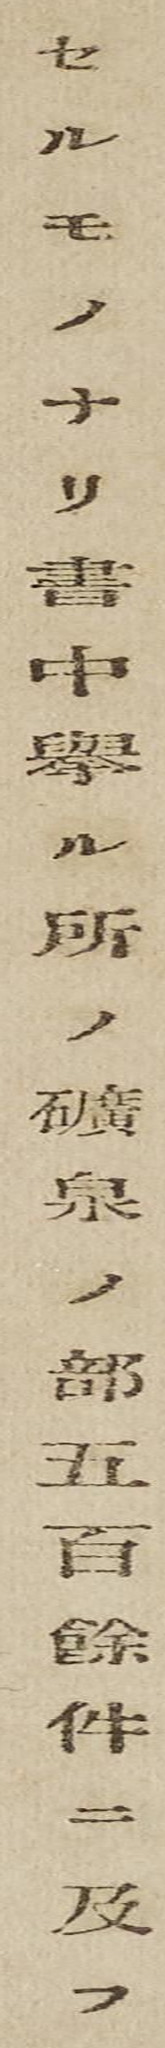セルモノナリ書中挙ル所ノ礦泉ノ部五百余件ニ及フ
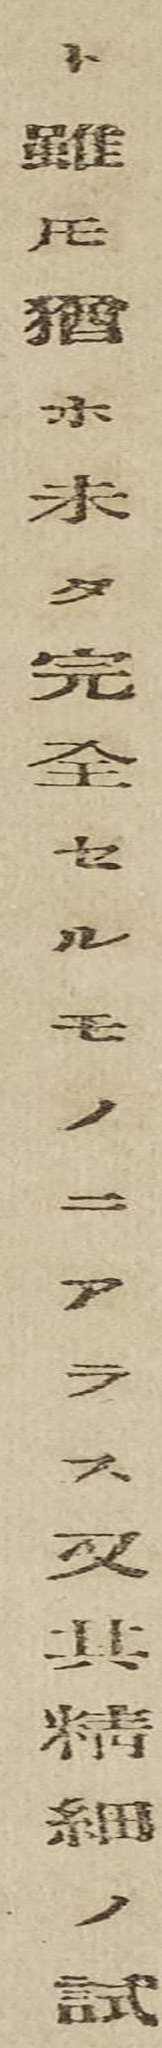ト雖トモ猶ホ未タ完全セルモノニアラス又其精細ノ試
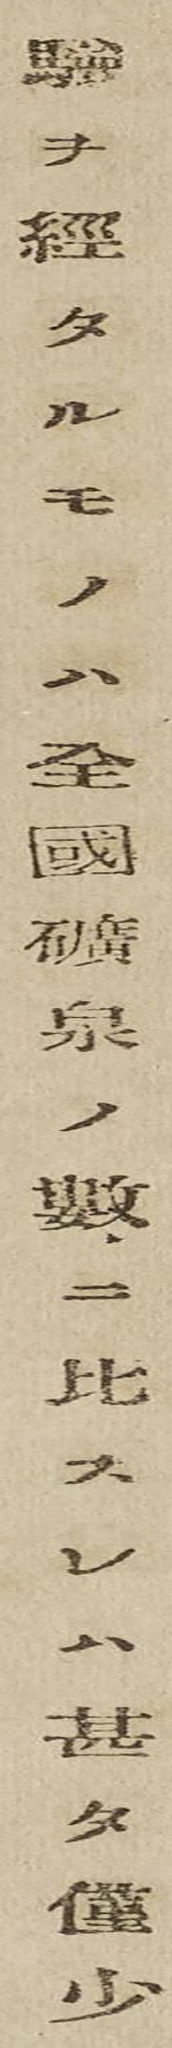験ヲ経タルモノハ全国礦泉ノ数ニ比スレハ甚タ僅少
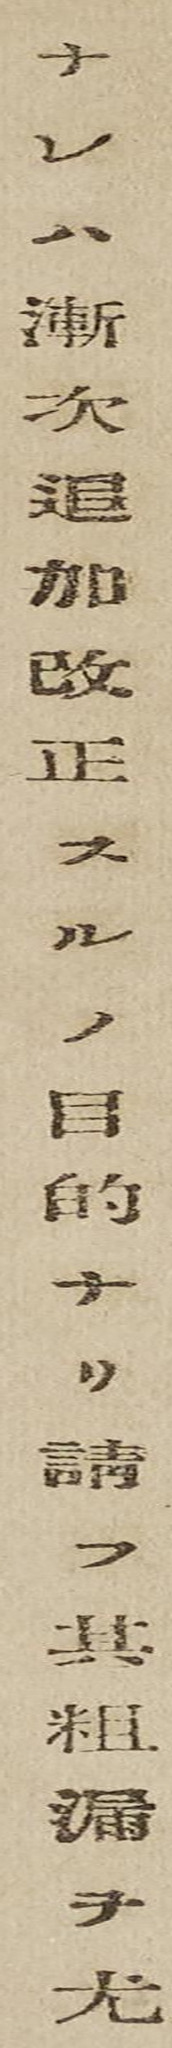ナレハ漸次追加改正スルノ目的ナリ請フ其粗漏ヲ尤
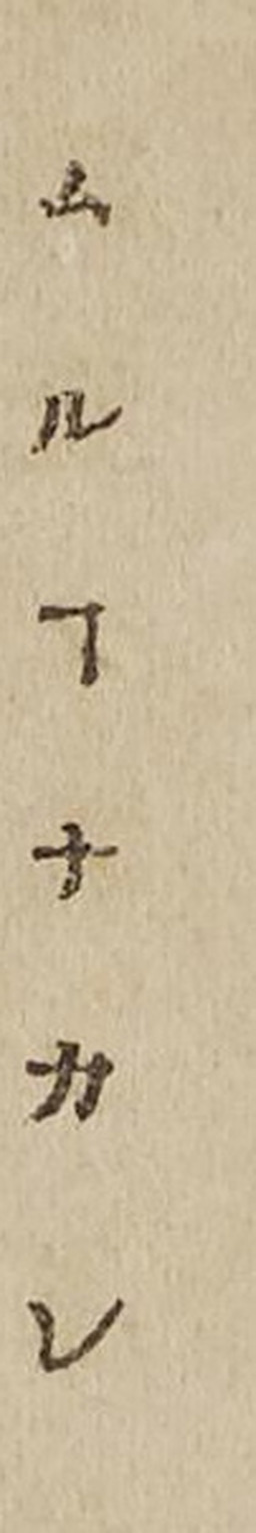ムルコトナカレ
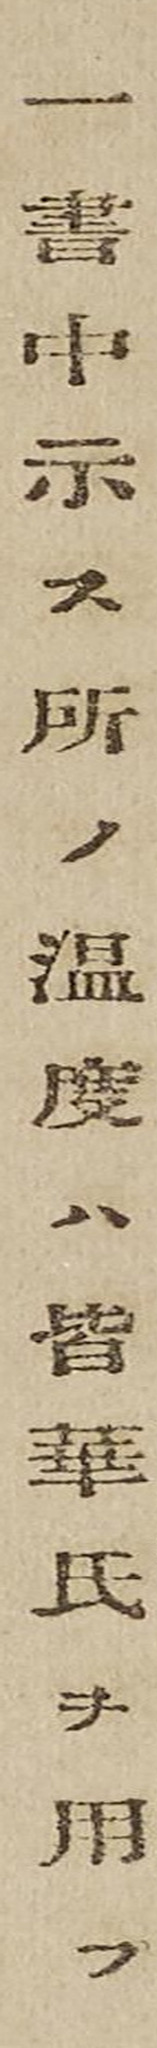一書中示ス所ノ温度ハ皆華氏ヲ用フ
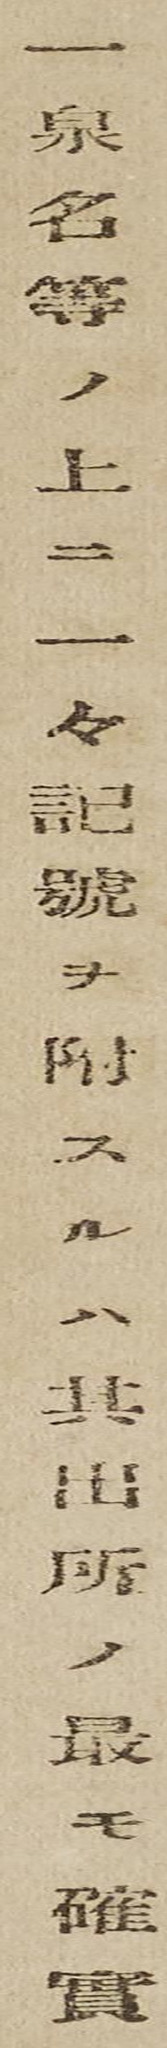一泉名等ノ上ニ一々記号ヲ附スルハ其出所ノ最モ確実
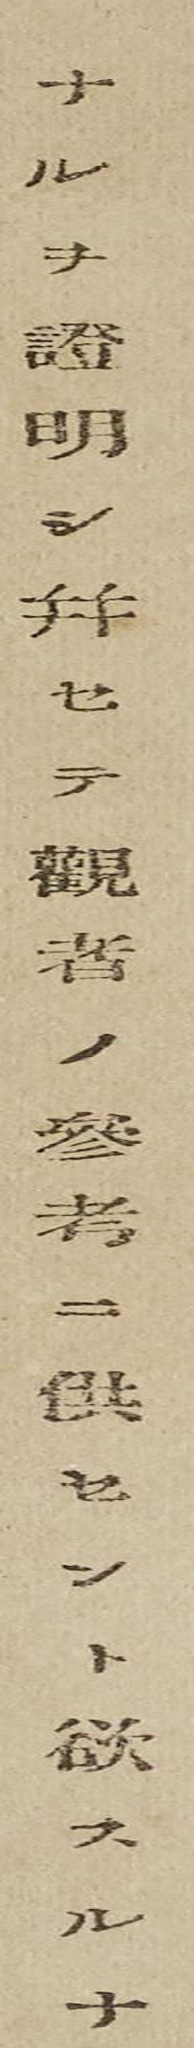ナルヲ証明シ併セテ観者ノ参考ニ供セント欲スルナ
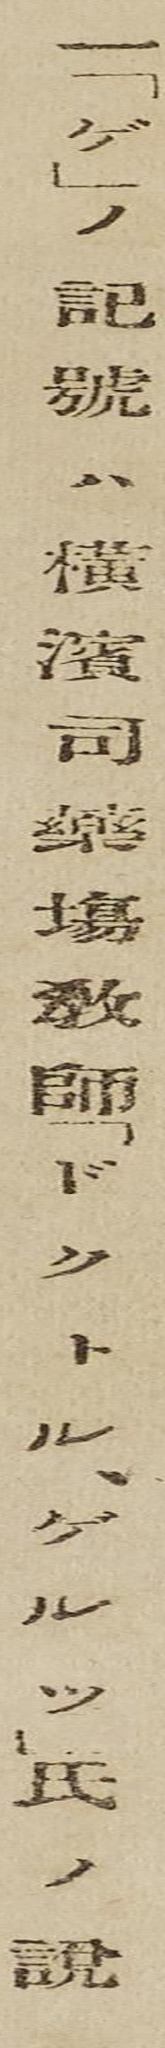一「ゲ」ノ記号ハ横浜司薬場教師「ドクトル、ゲルツ」氏ノ説
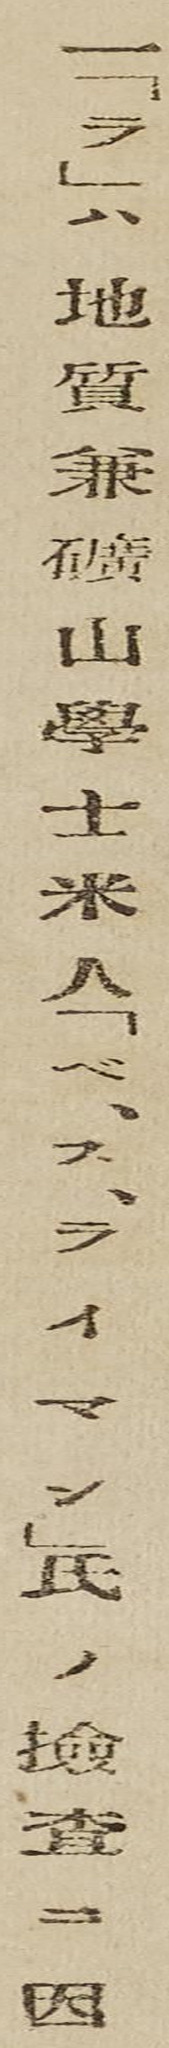一「ラ」ハ地質兼礦山学士米人「ベ、ス、ライマン」氏ノ検査ニ因
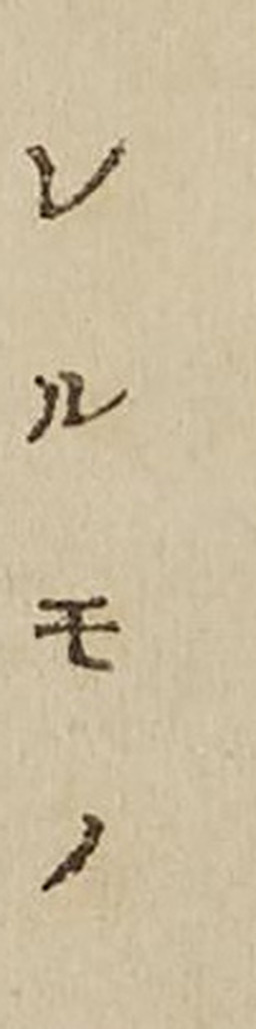レルモノ
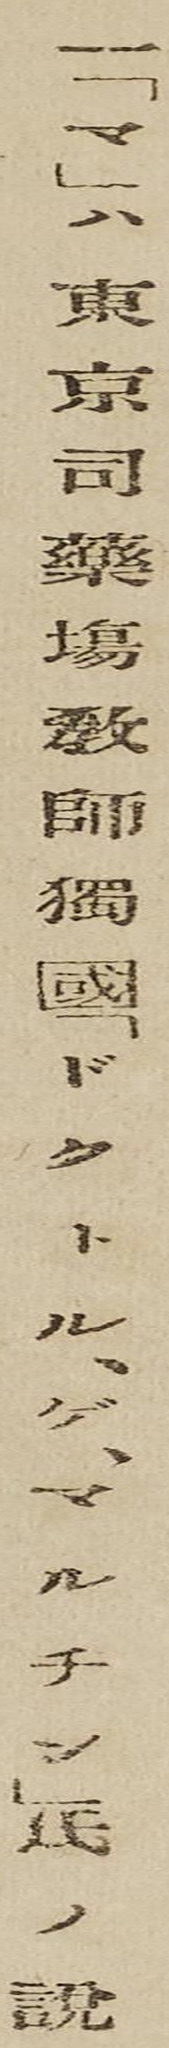一「マ」ハ東京司薬場教師独国「ドクトル、ゲ、マルチン」氏ノ説
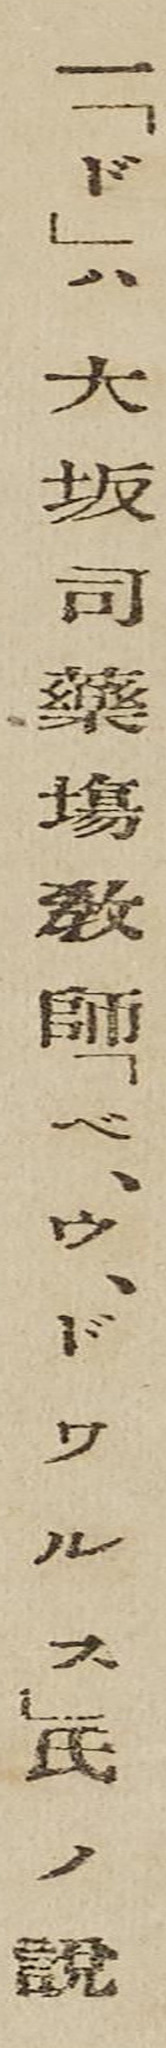一「ド」ハ大坂司薬場教師「ベ、ウ、ドワルス」氏ノ説
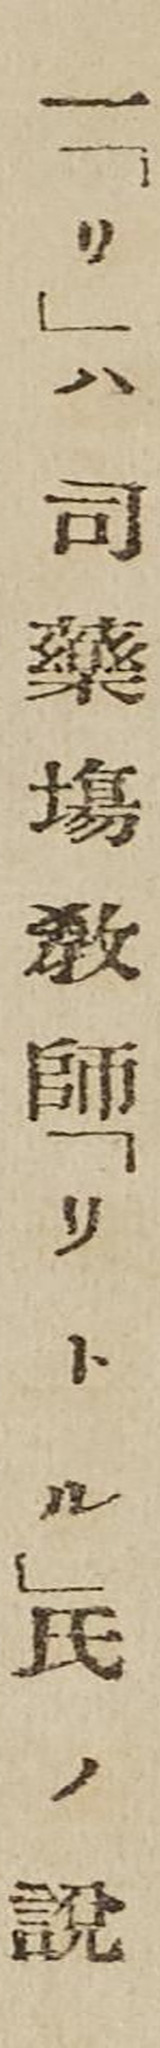一「リ」ハ司薬場教師「リトル」氏ノ説
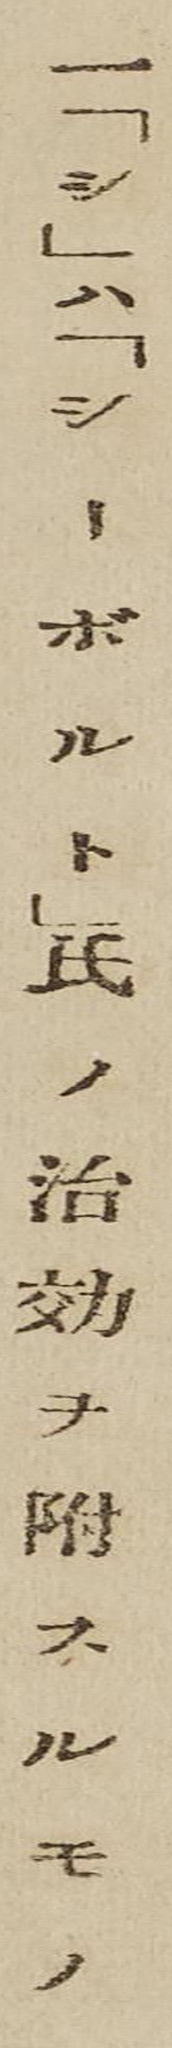一「シ」ハ「シーボルト」氏ノ治効ヲ附スルモノ
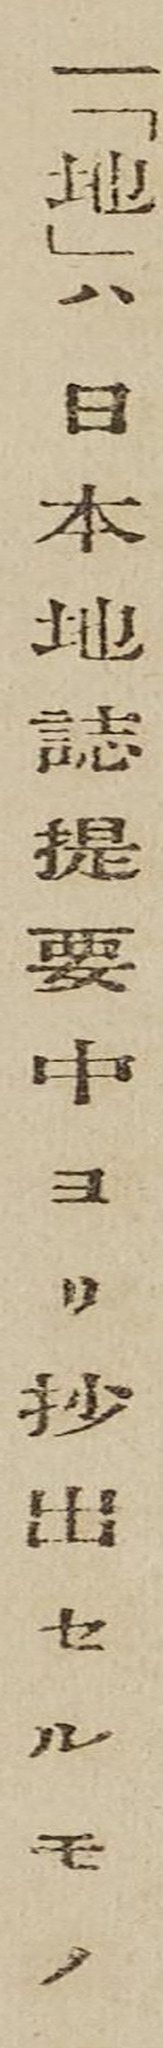一「地」ハ日本地誌提要中ヨリ抄出セルモノ
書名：日本温泉考
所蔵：東京大学地震研究所図書室 Earthquake Research Institute Library, The University of Tokyo, JAPAN
